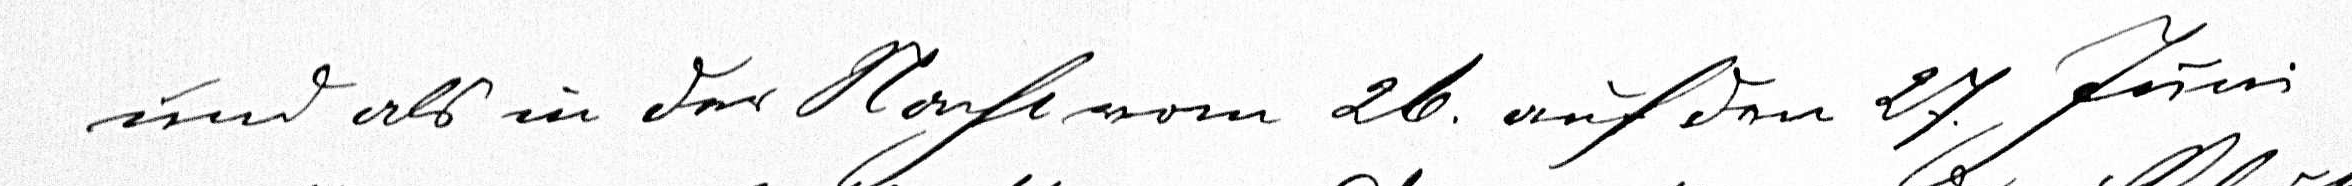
und als in der Nacht vom 26. auf den 27. Juni
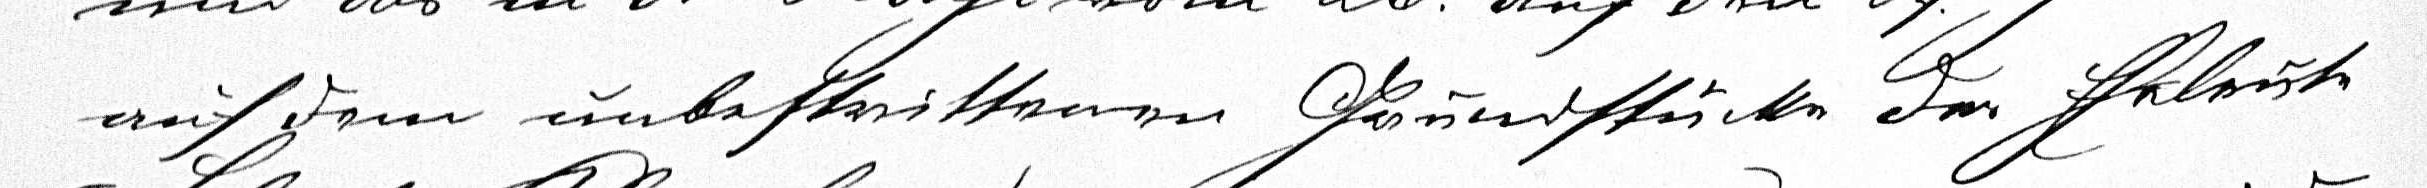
auf dem unbestrittenen Grundstücke der Eheleute
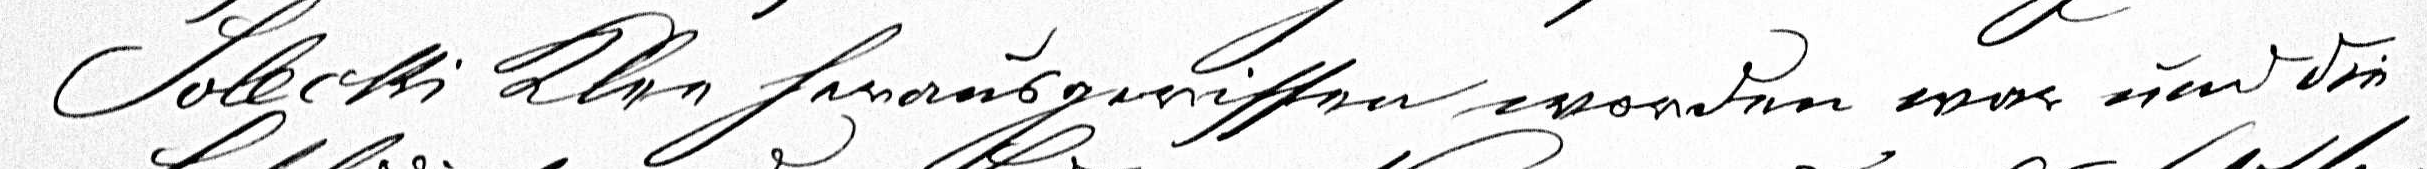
Solecki Klee herausgerissen worden war und die
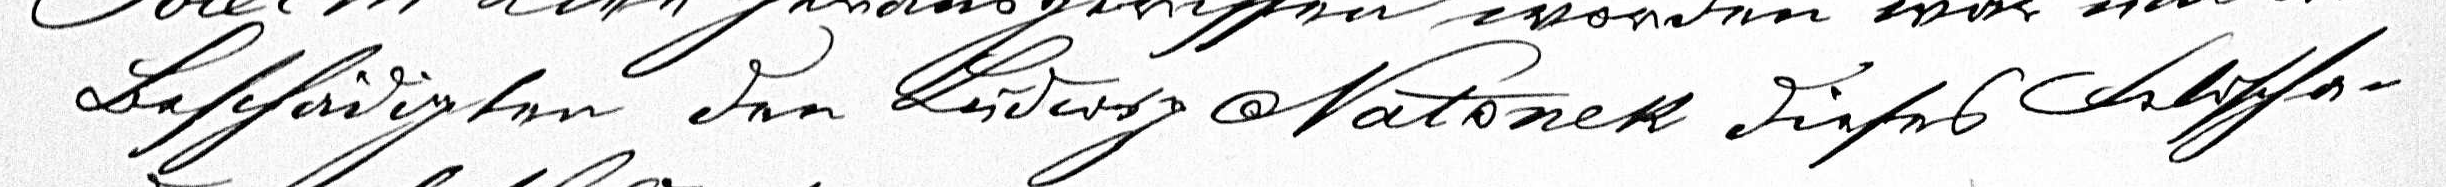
Beschädigten den Ludwig Natonek dieses Feldscha¬
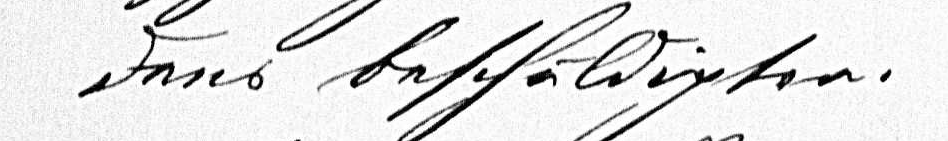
dens beschuldigten.
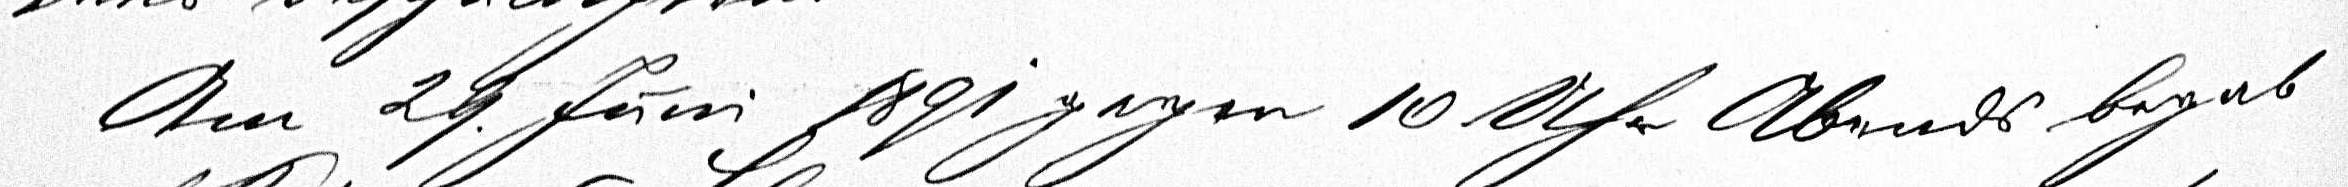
Am 29. Juni 1891 gegen 10 Uhr Abends begab
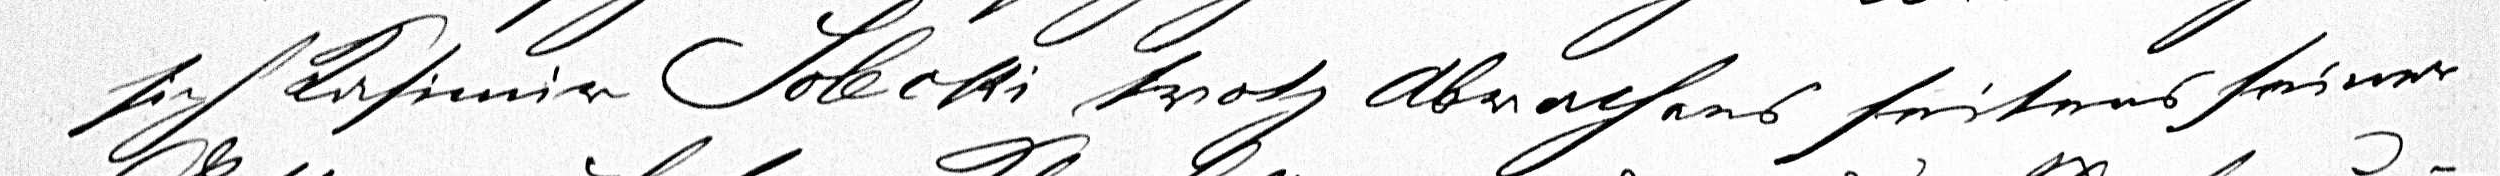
sich Kasimir Solecki trotz Abrathens seitens seiner
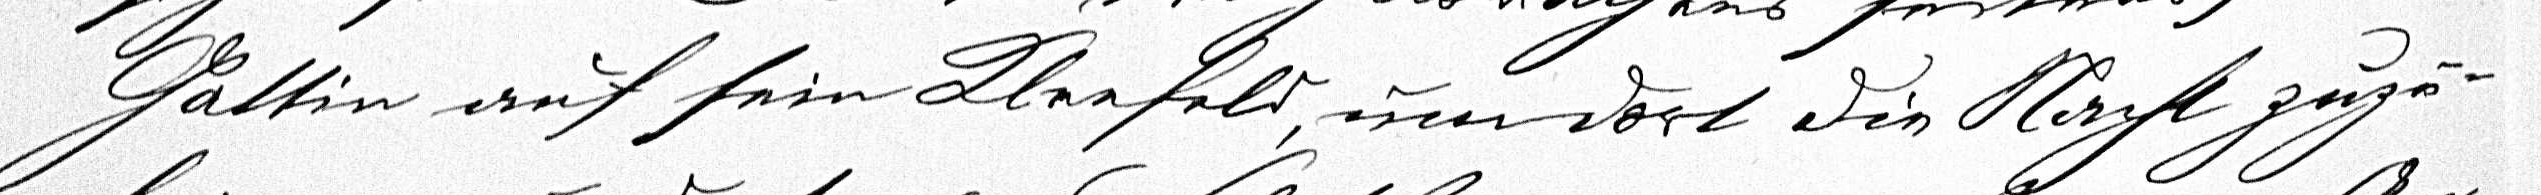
Gattin auf sein Kleefeld, um dort die Nacht zuzu¬
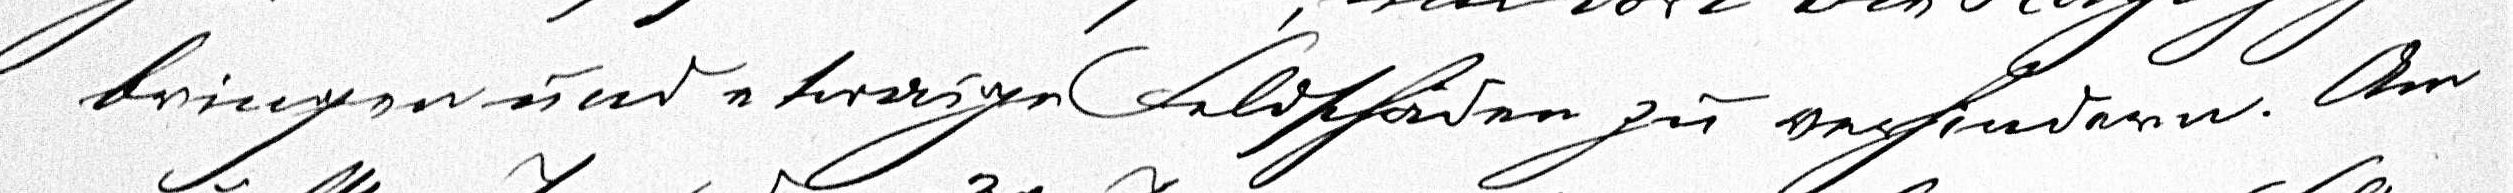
bringen und etwaigen Feldschäden zu verhindern. Am
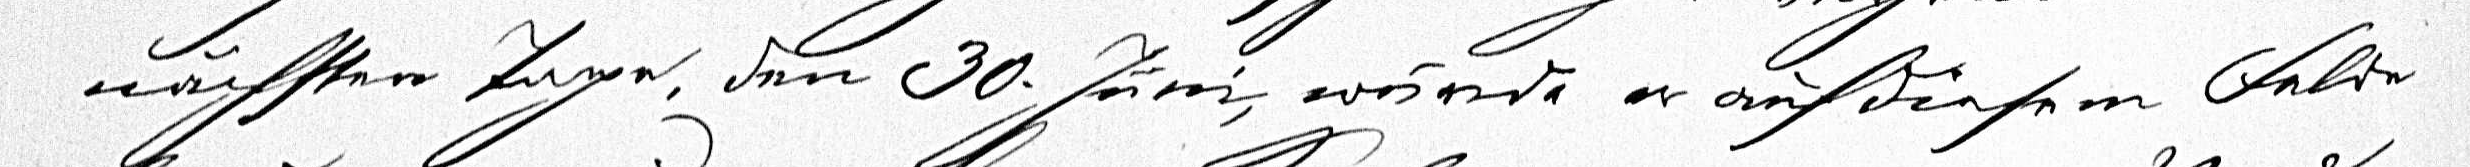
nächsten Tage, den 30. Juni, wurde er auf diesem Felde
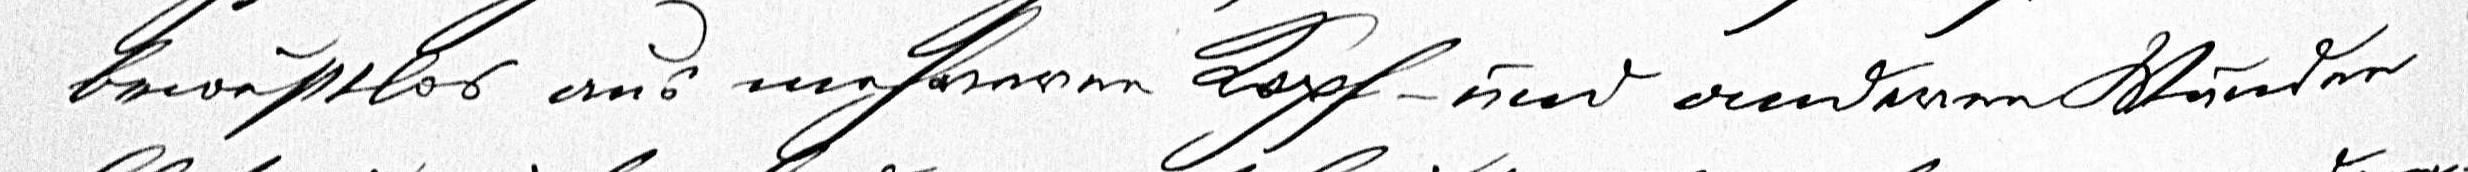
bewußtlos aus mehreren Kopf- und anderen Wunden
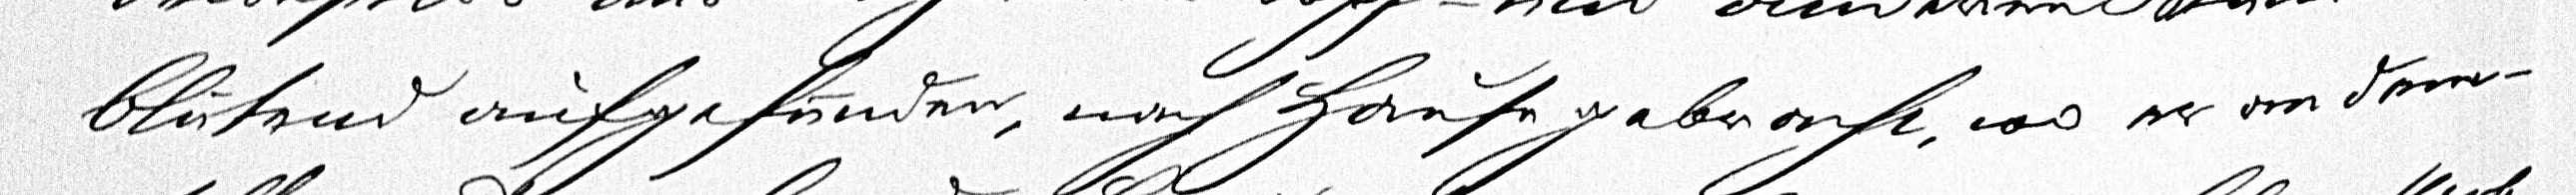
blutend aufgefunden, nach Hause gebracht, wo er am dem¬
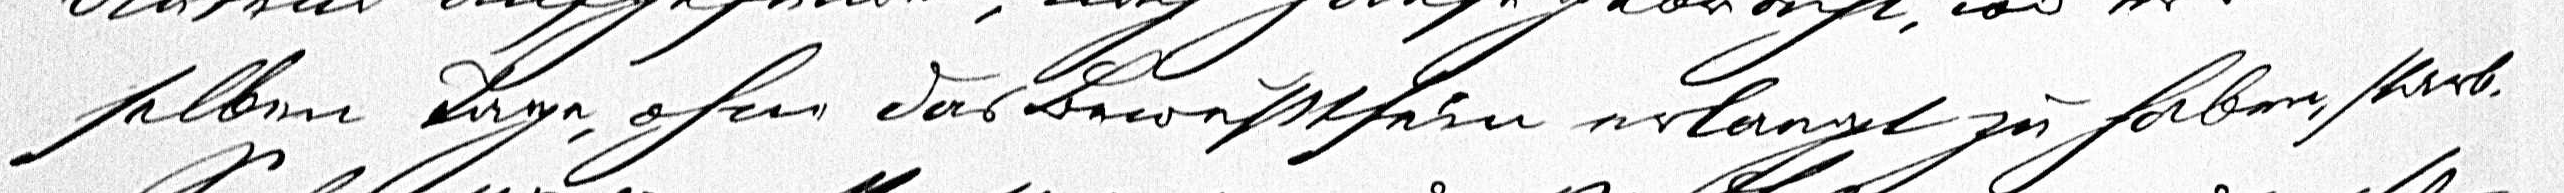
selben Tage, ohne das Bewußtsein erlangt zu haben, starb.
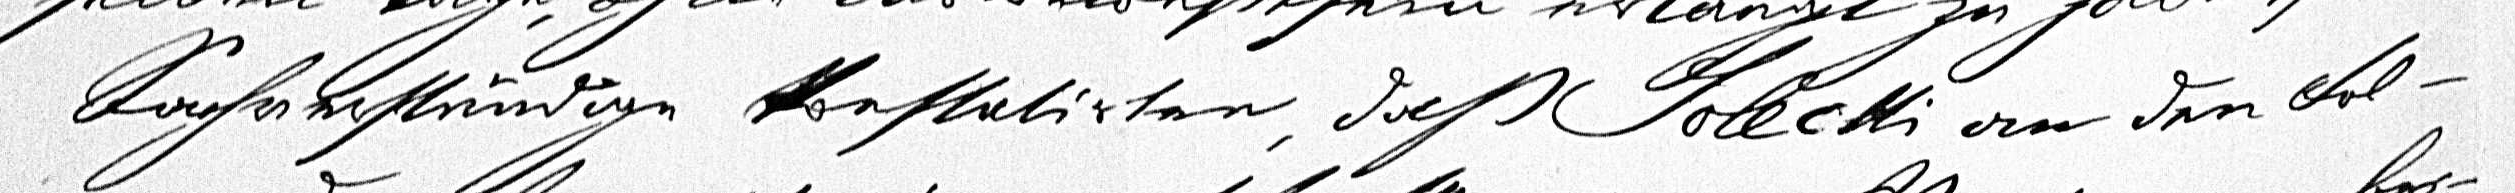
Sachverständige konstatirten, daß Solecki an den fol¬
